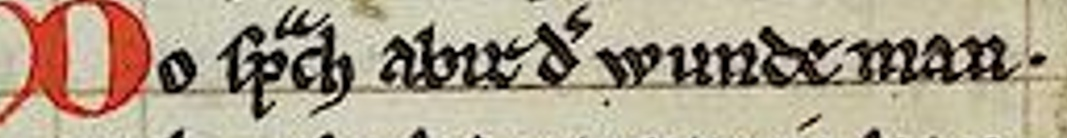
*Do ſp(ra)ch abir d(er) wunde man.
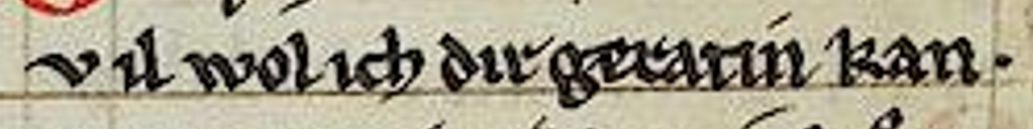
Vil wol ich dir geratzin kan.
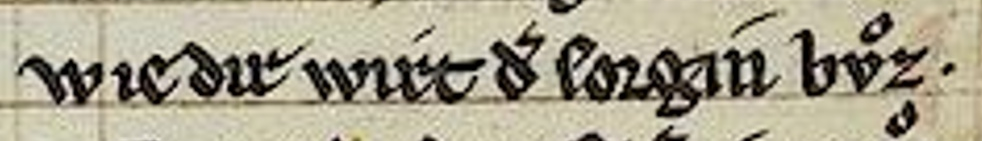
Wie dir wirt d(er) ſorgin bv°oz.
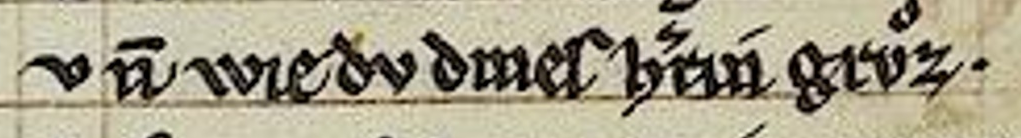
Vn(d) wie dv dineſ h(er)rin grv°oz.
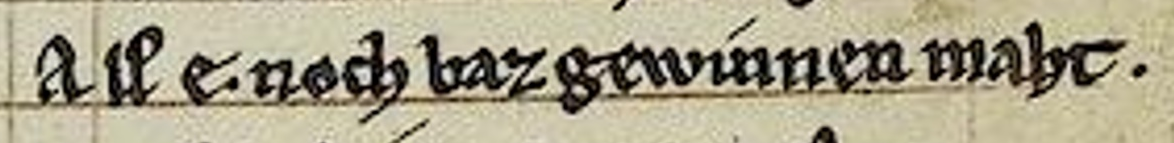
Alſ e noch baz gewinnen maht.
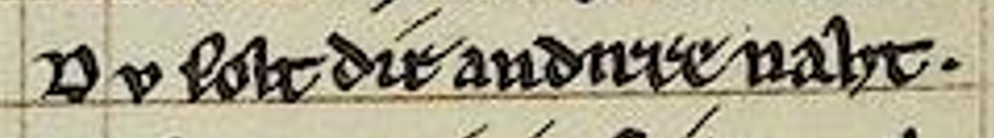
Dv ſolt dir andirre naht.
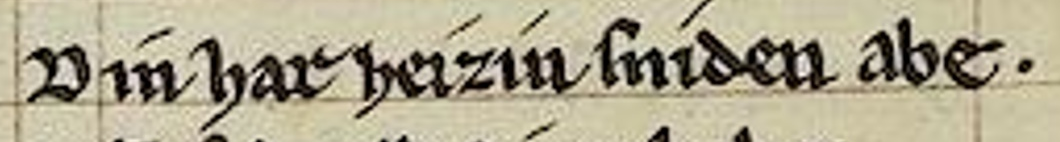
Din har heizin ſniden abe.
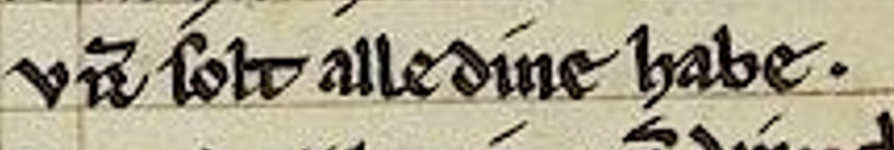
Vn(d) ſolt alle dine habe.
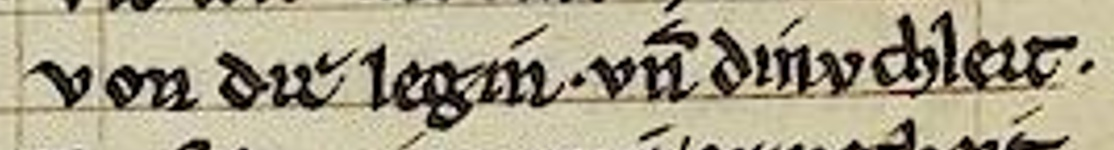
Von dir legin. vn(d) dinv chleit.
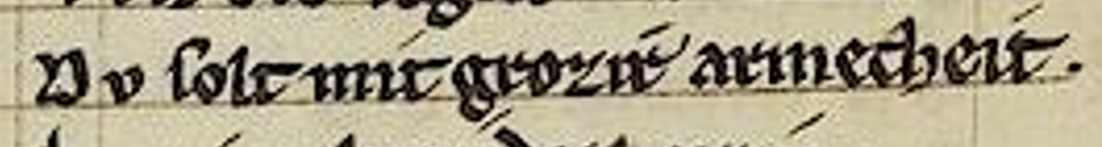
Dv ſolt mit grozir armecheit.
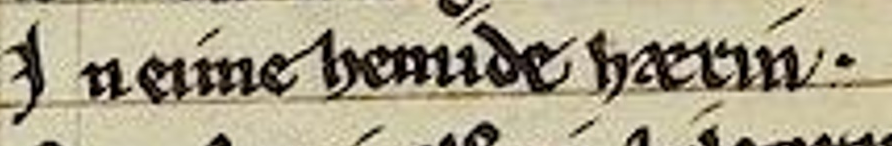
In eime hemide h[ae]rin.
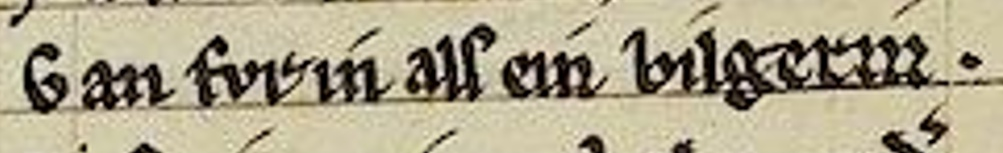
Gan fvr in alſ ein bilgerin.
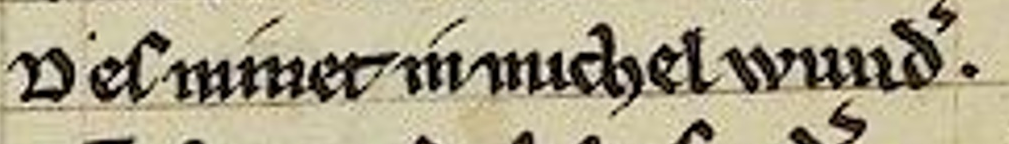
Deſ nimet in michel wund(er).
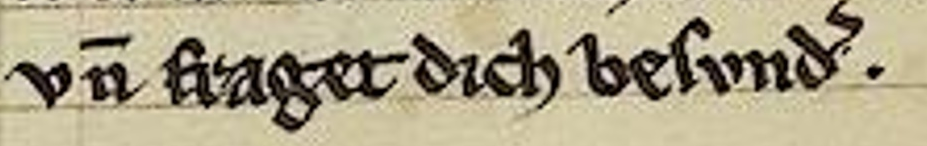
Vn(d) fraget dich beſvnd(er).
